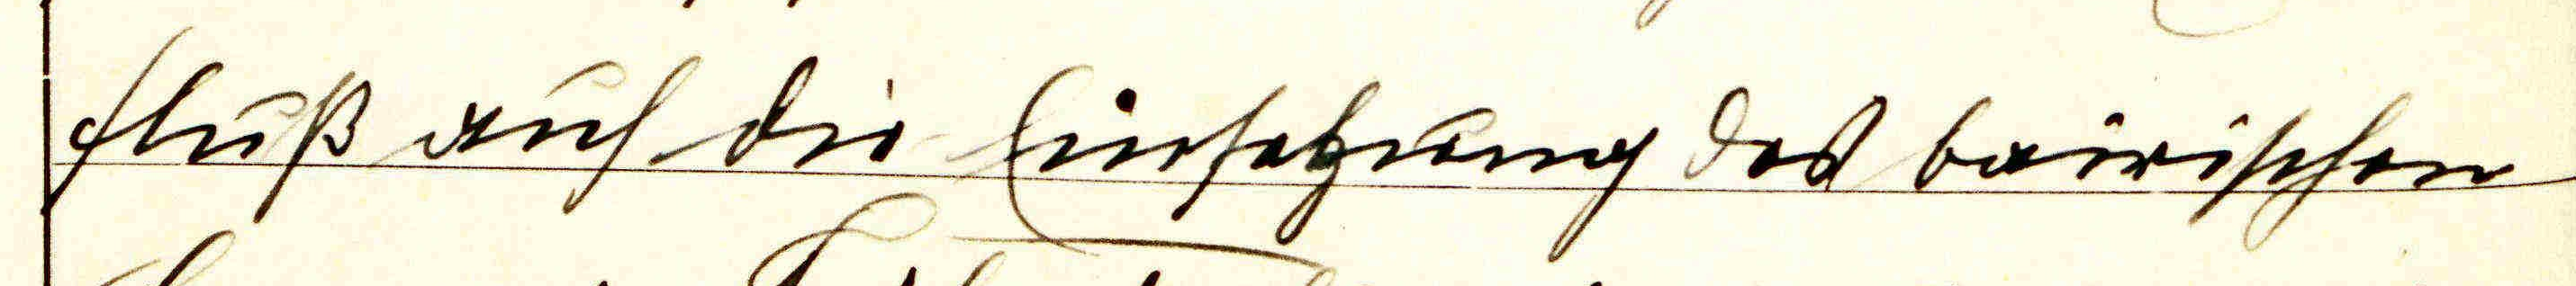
fluß auf die Einsetzung des bairischen
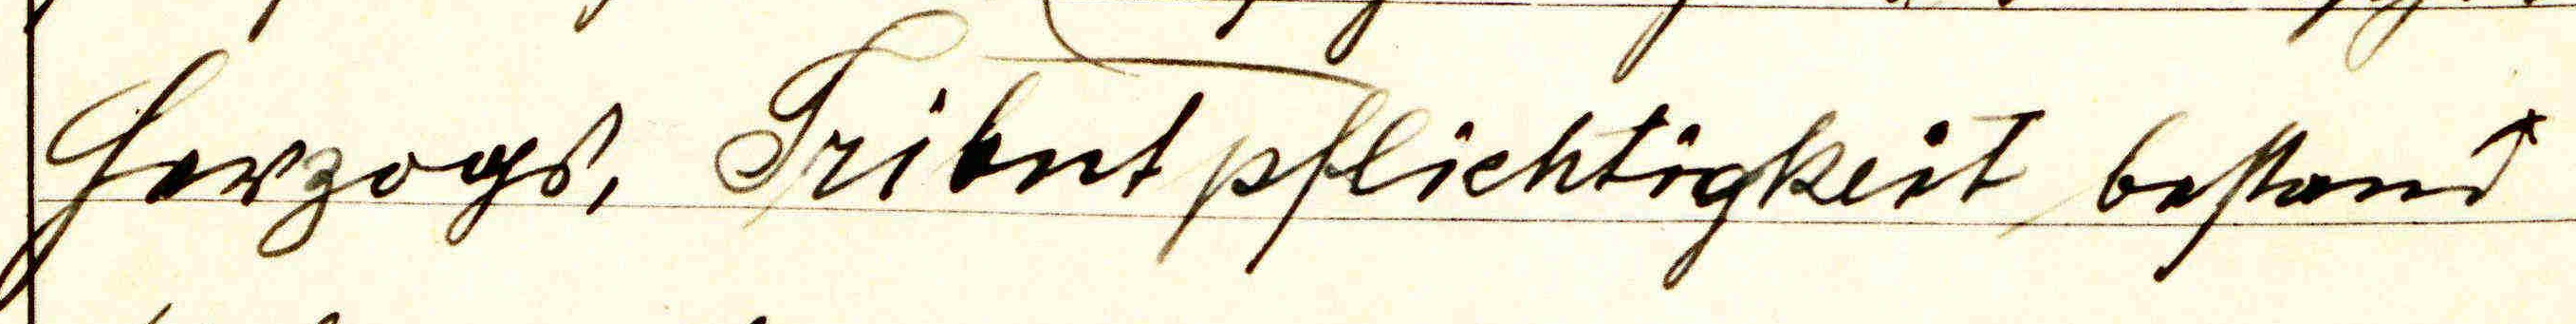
Herzogs, Tributpflichtigkeit bestand
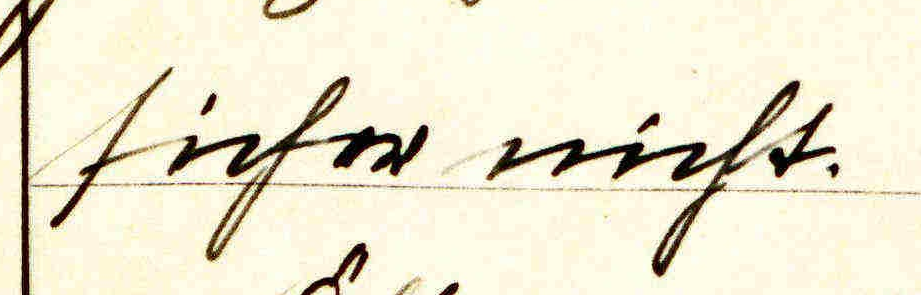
sicher nicht.
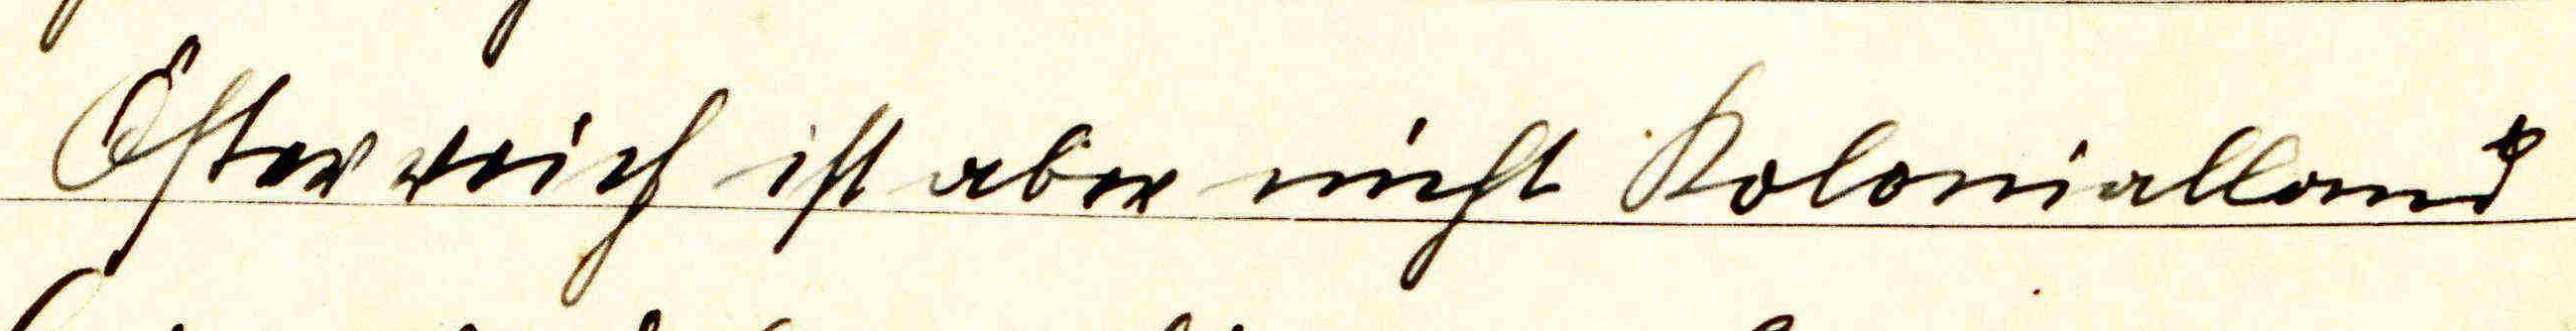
Österreich ist aber nicht Kolonialland
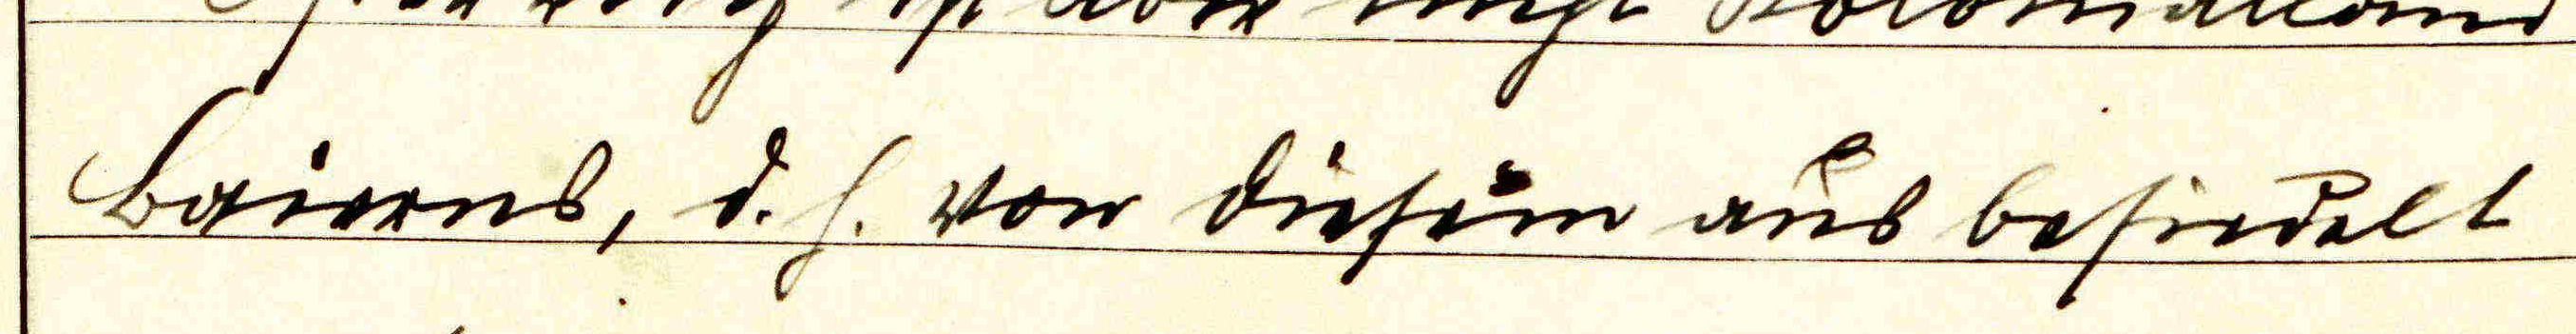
Baierns, d. h. von diesem aus besiedelt
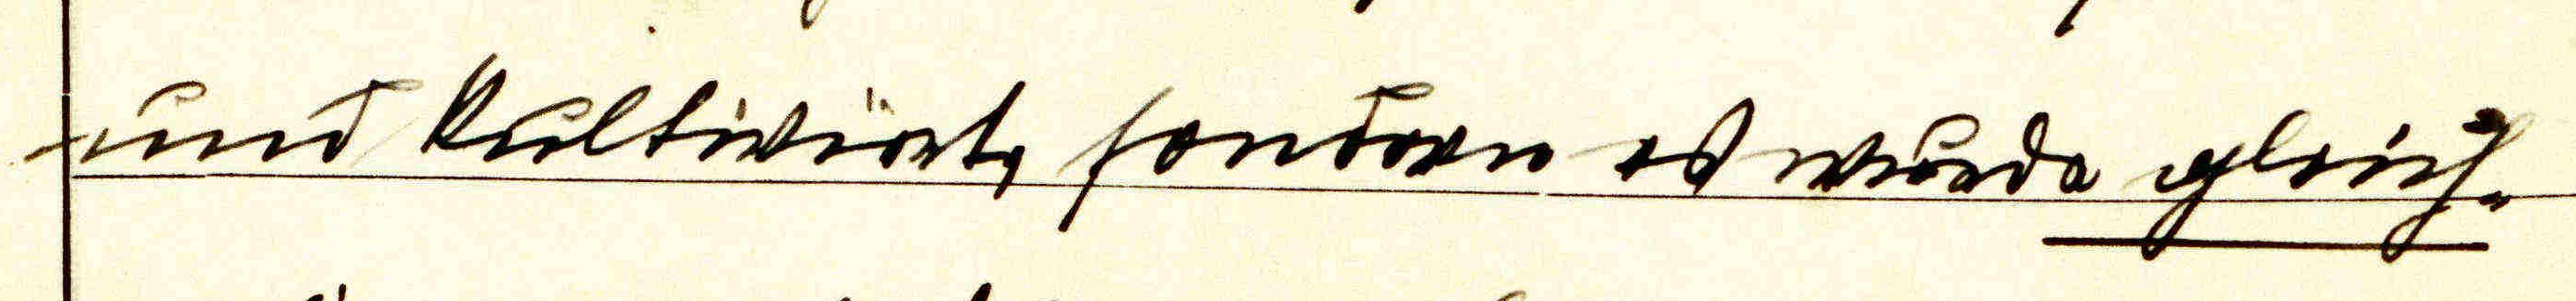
und kultivierte sondern es wurde gleich-
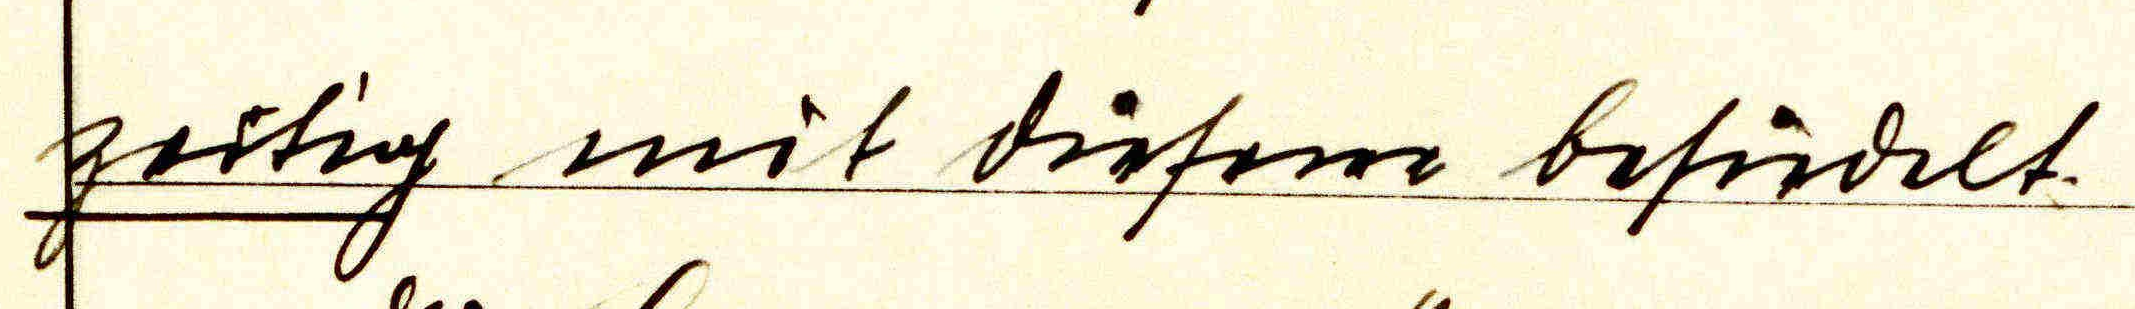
zeitig mit diesem besiedelt.
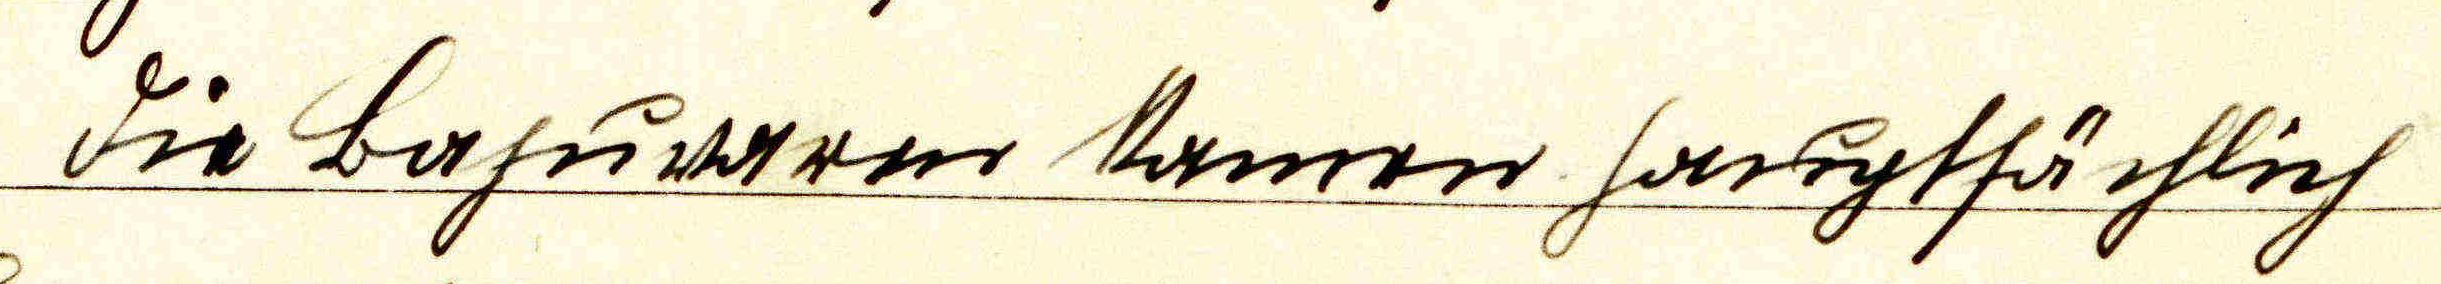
Die Bajuwaren kamen hauptsächlich
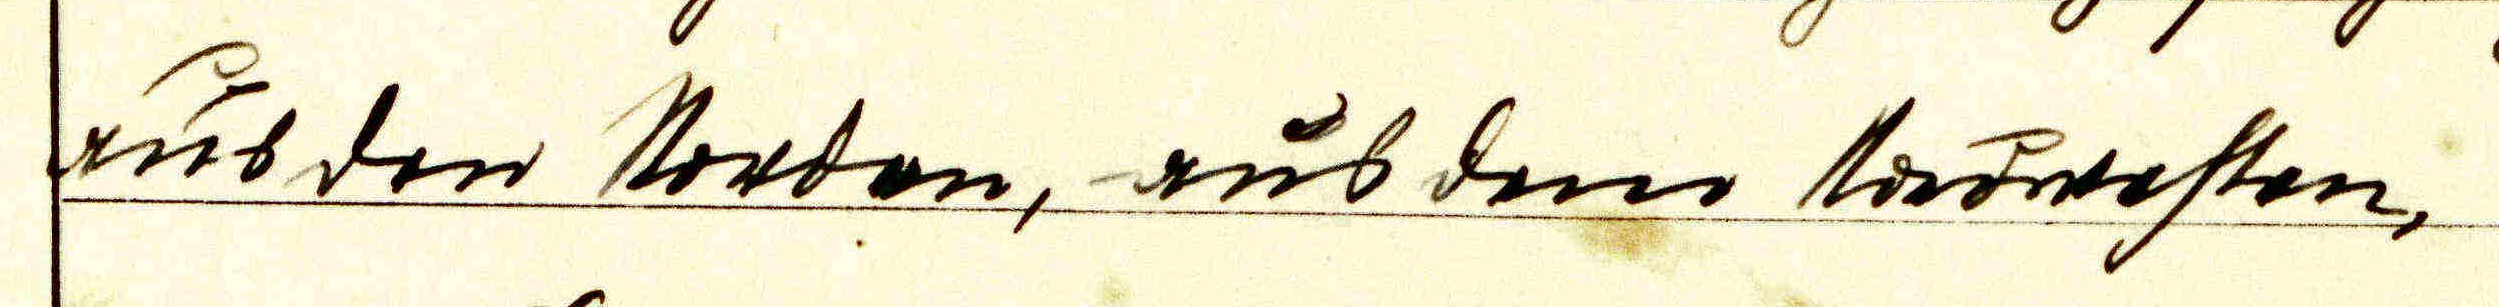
aus dem Norden, aus dem Nordwesten,
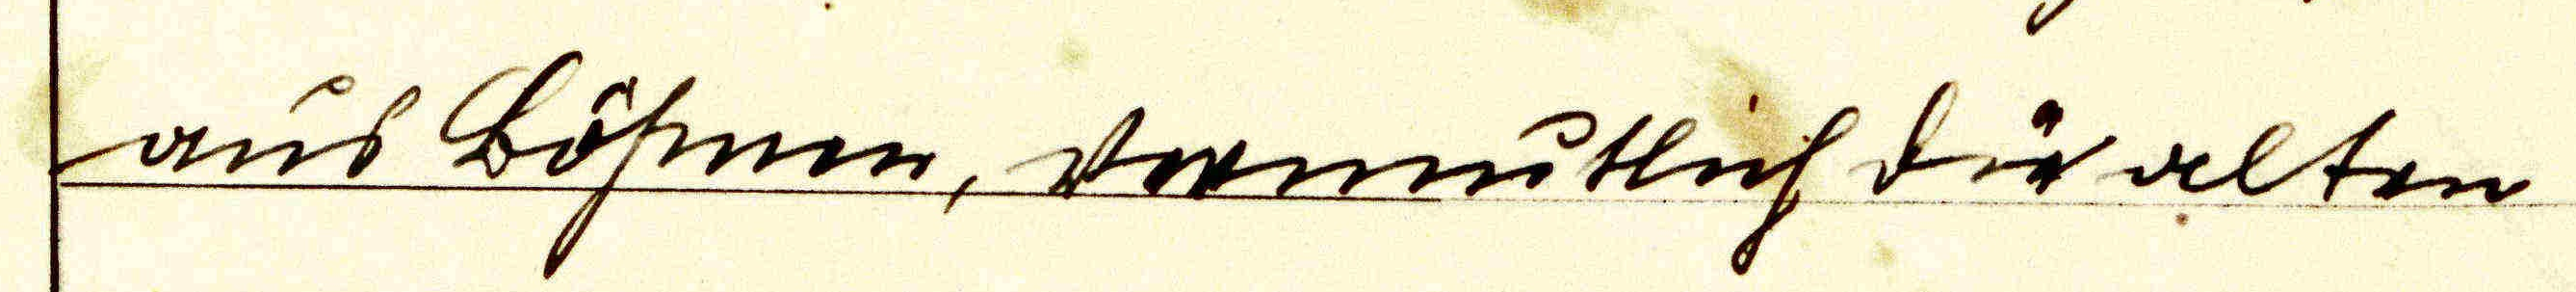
aus Böhmen, vermutlich die alten
